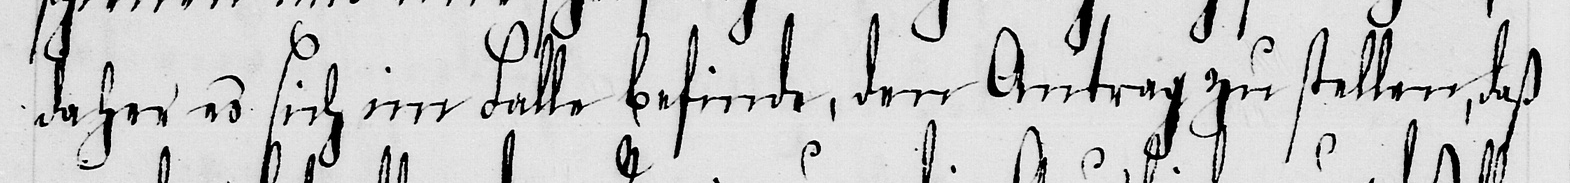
daher es sich im Falle befinde, den Antrag zu stellen, daß
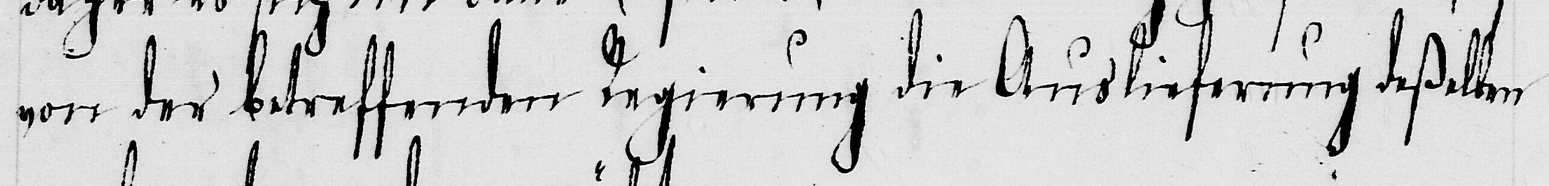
von der betreffenden Regierung die Auslieferung deßelben
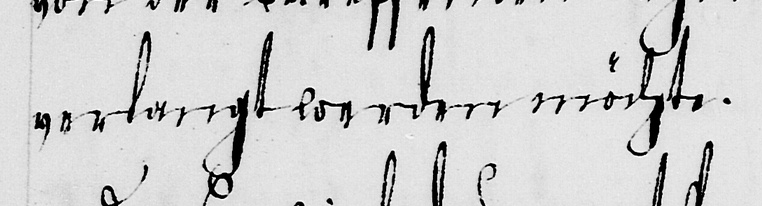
verlangt werden möchte.
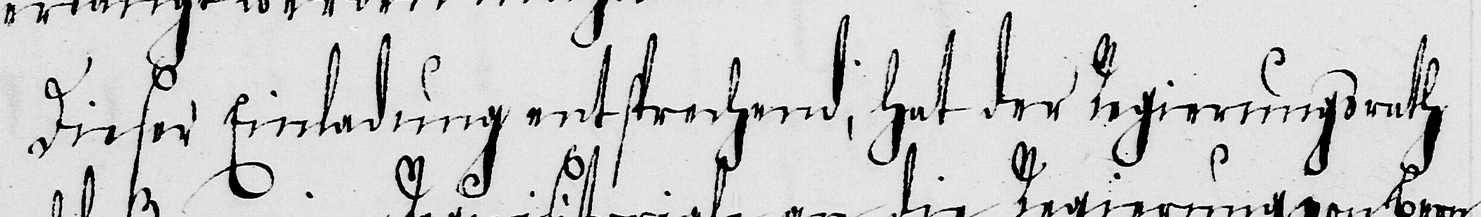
Dieser Einladung entsprechend, hat der Regierungsrath
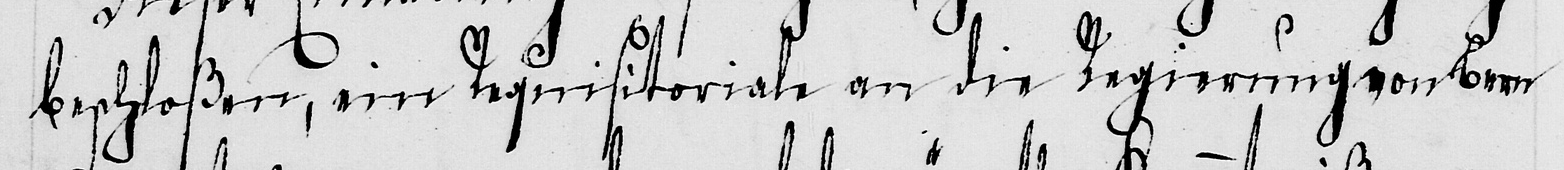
beschloßen, ein Requisitoriale an die Regierung von Bern
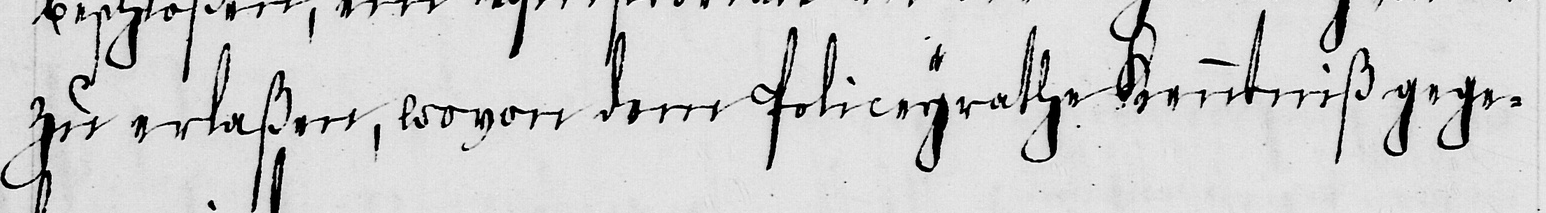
zu erlaßen, wovon dem Policeyrathe Kenntniß gege¬
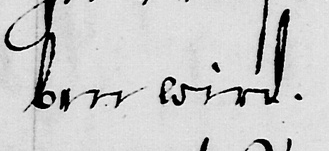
ben wird.
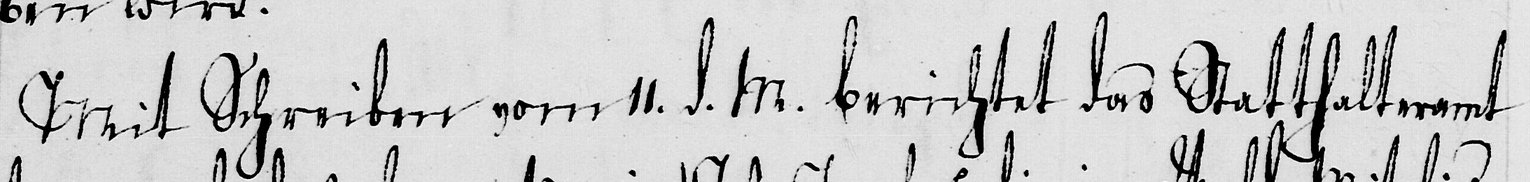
Mit Schreiben vom 11. d. M. berichtet das Statthalteramt
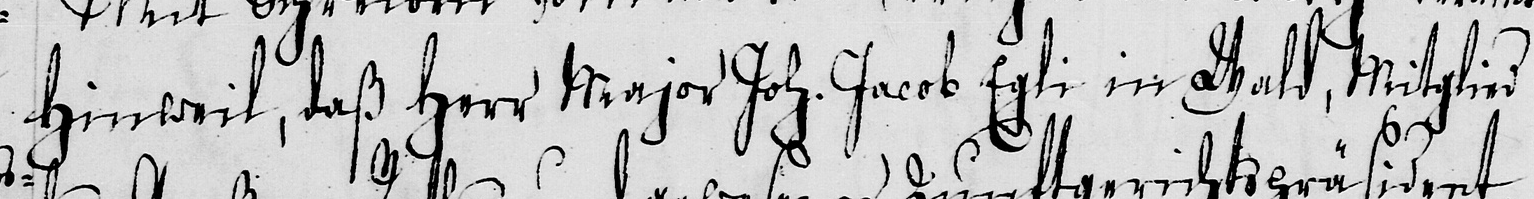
Hinweil, daß Herr Major Joh. Jacob Egli in Wald, Mitglied
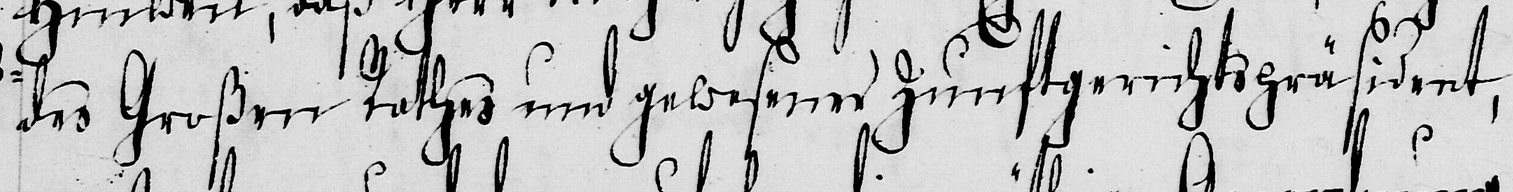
des Großen Rathes und gewesener Zunftgerichtspräsident,
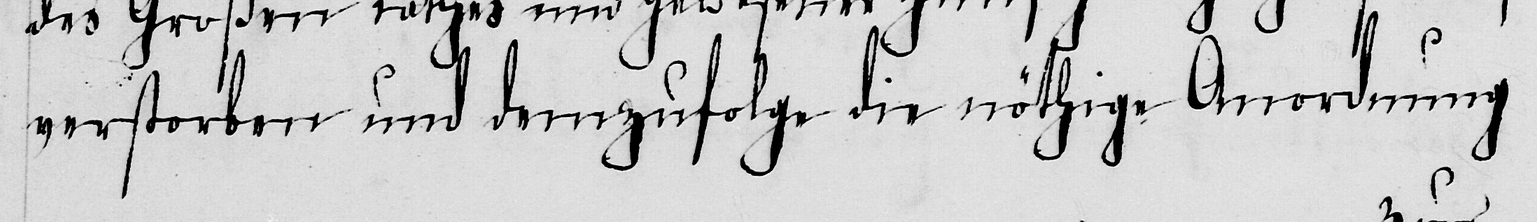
verstorben und demzufolge die nöthige Anordnung
